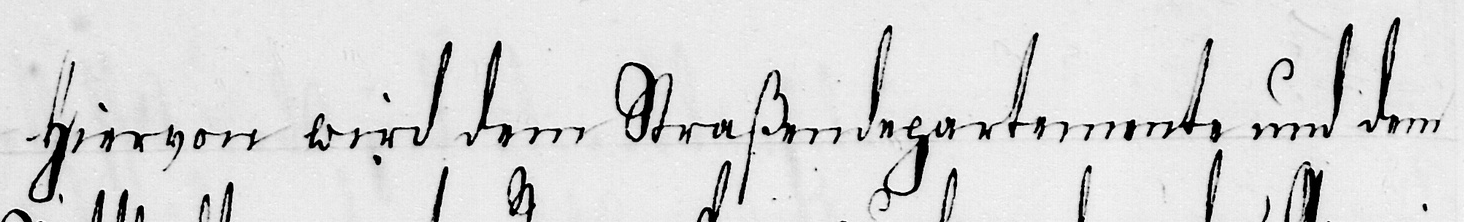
Hiervon wird dem Straßendepartemente und dem
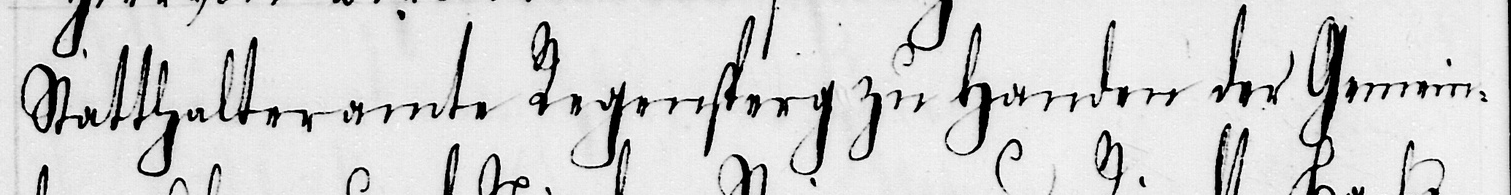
Statthalteramte Regensperg zu Handen der Gemein¬
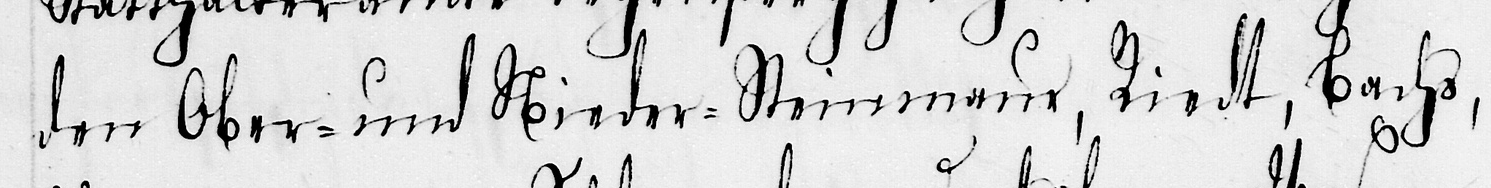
den Ober- und Nieder-Steinmaur, Lindt, Bachs,
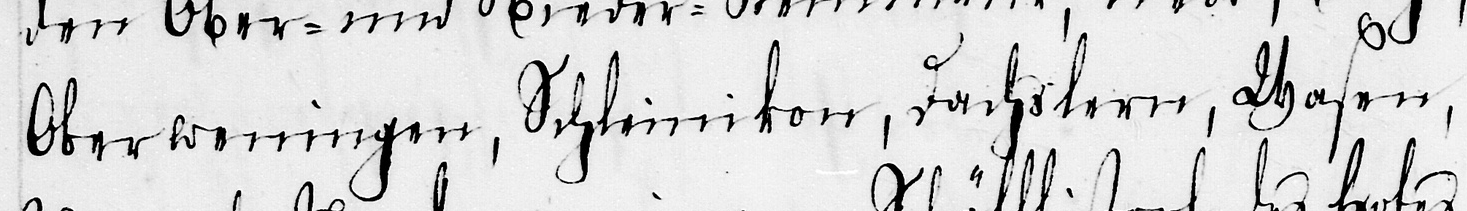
Oberweningen, Schleinikon, Dachslern, Wasen,
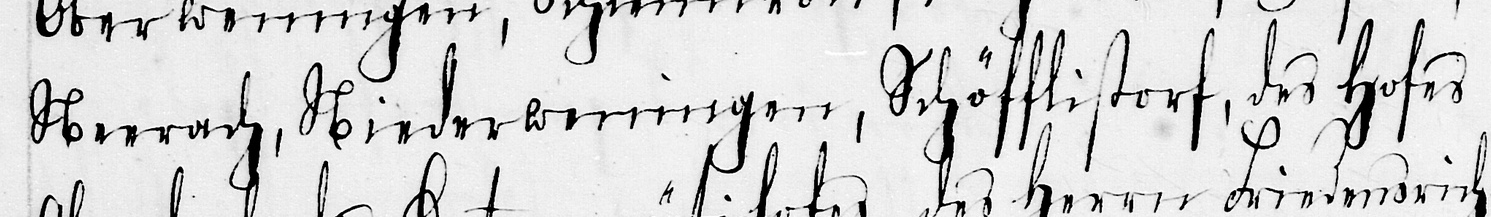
Neerach, Niederweningen, Schöfflistorf, des Hofes
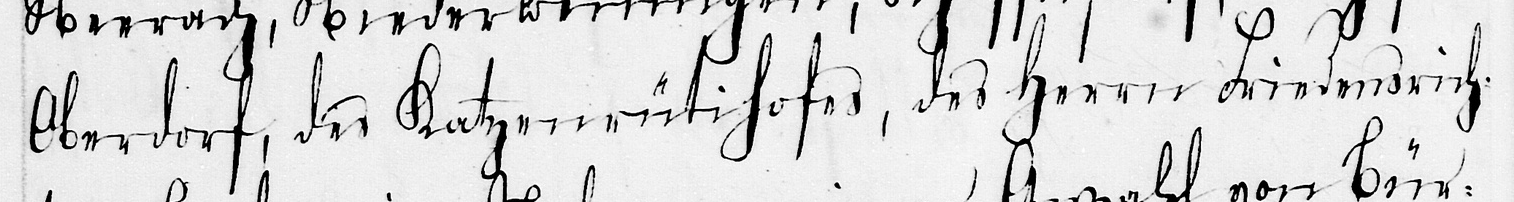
Oberdorf, des Katzenrütihofes, des Herrn Friedensrich¬
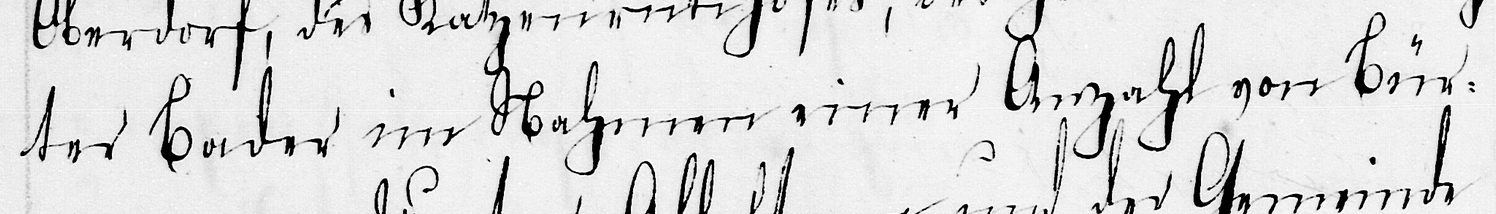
ter Bader im Nahmen einer Anzahl von Bür¬
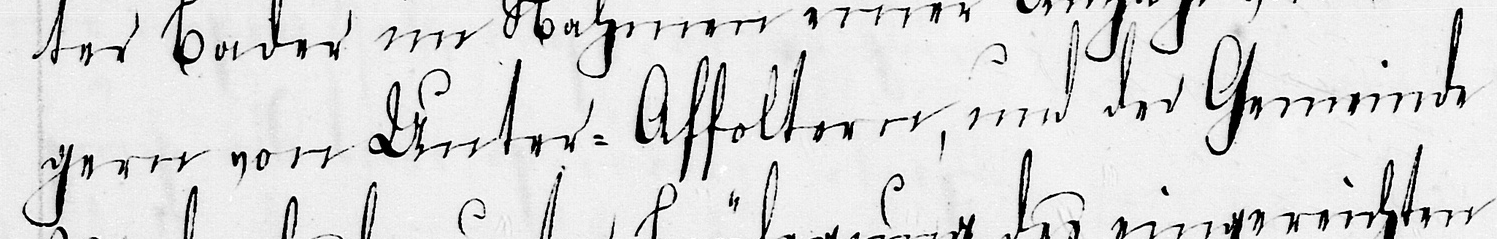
gern von Unter-Affoltern, und der Gemeinde
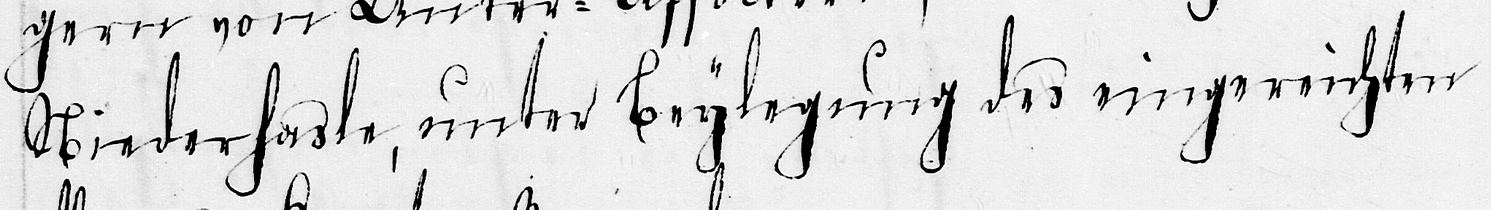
Niederhasle, unter Beylegung des eingereichten
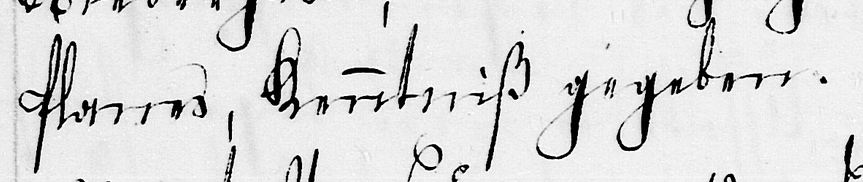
Planes, Kenntniß gegeben.
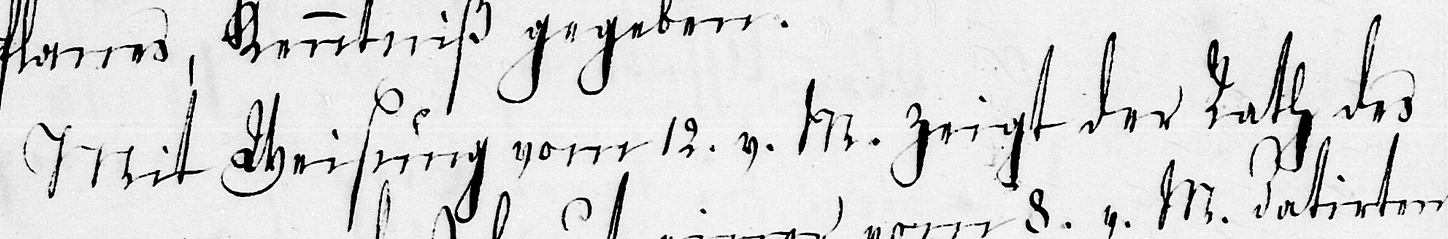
Mit Weisung vom 12. v. M. zeigt der Rath des
